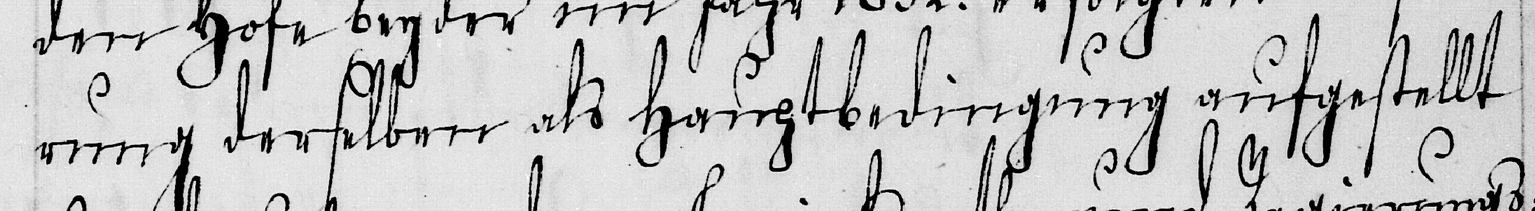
rung derselben als Hauptbedingung aufgestellt
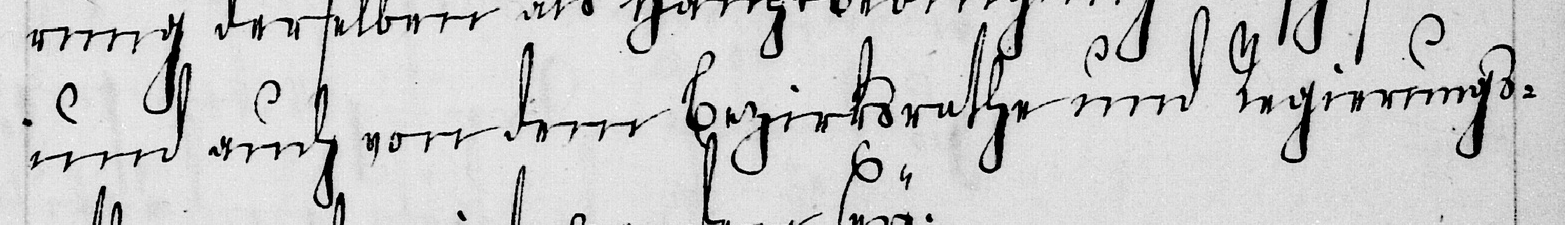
und auch von dem Bezirksrathe und Regierungs¬
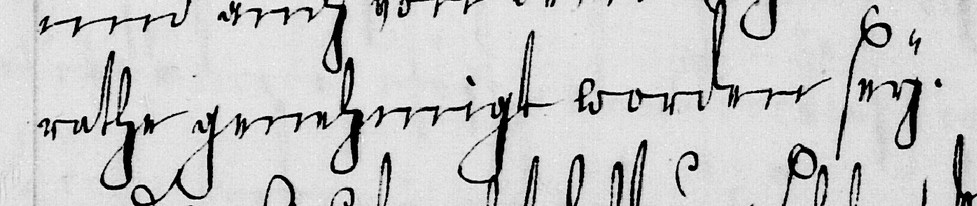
rathe genehmigt worden sey.
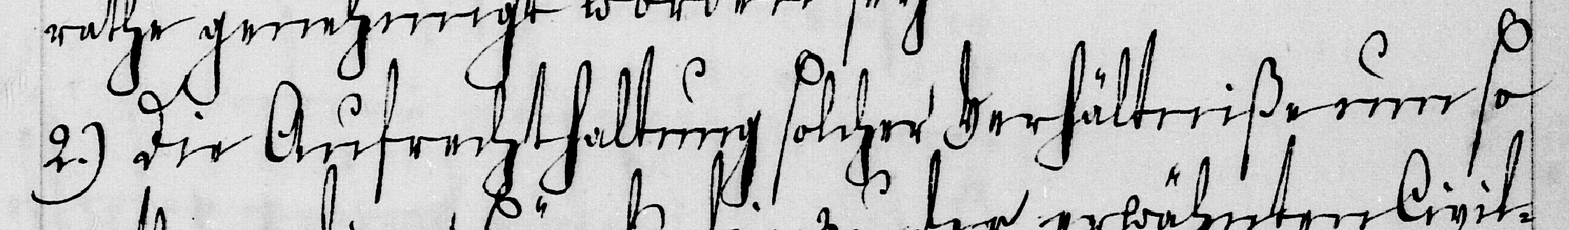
2.) Die Aufrechthaltung solcher Verhältniße um so
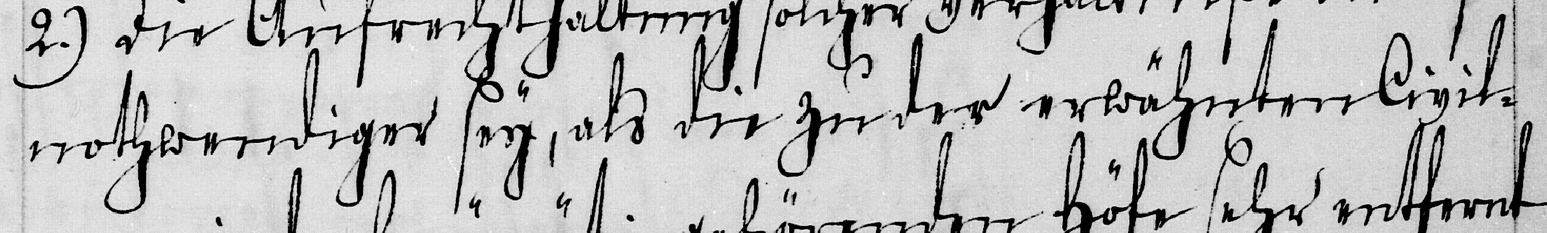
nothwendiger sey, als die zu der erwähnten Civil¬
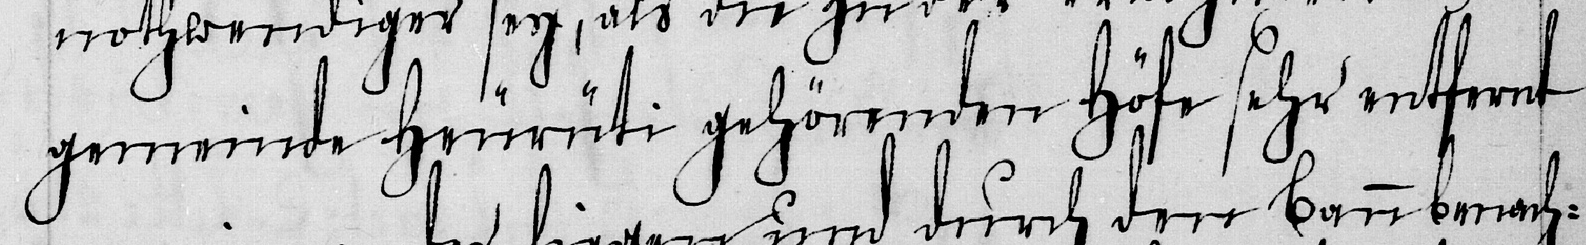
gemeinde Heurüti gehörenden Höfe sehr entfernt
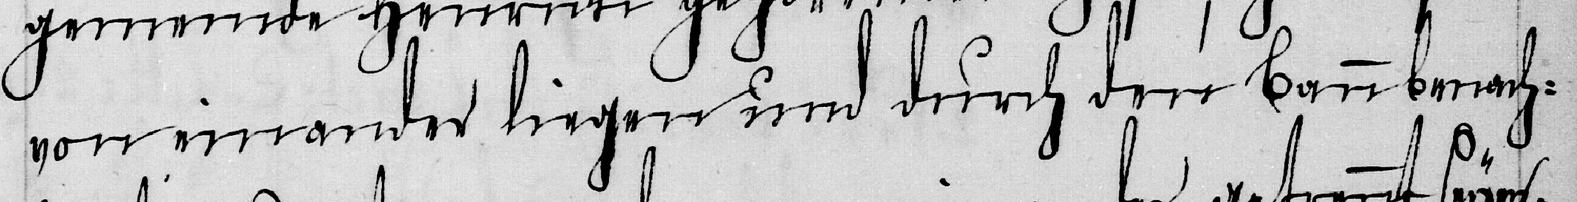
von einander liegen und durch den Bau benach¬
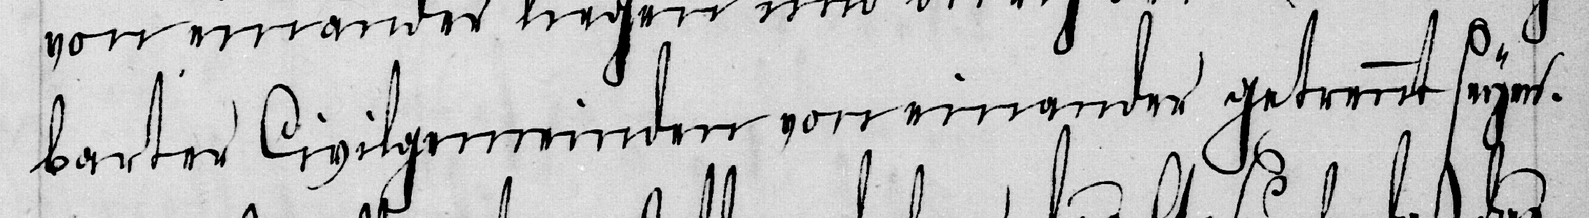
barter Civilgemeinden voneinander getrennt seyen.
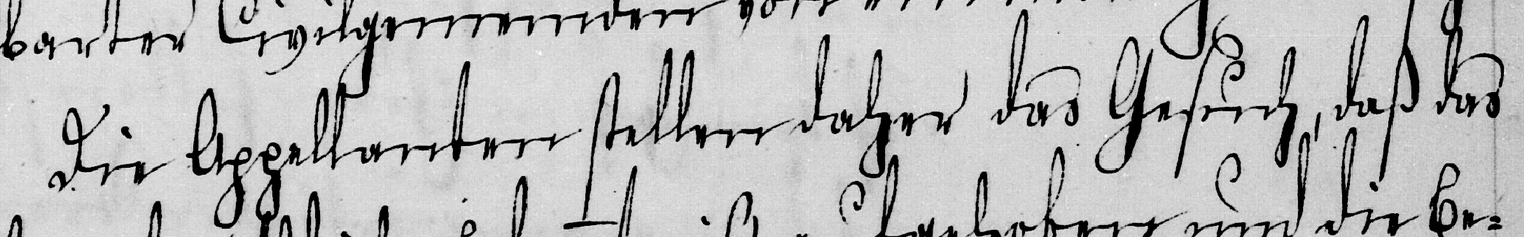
Die Appellanten stellen daher das Gesuch, daß das
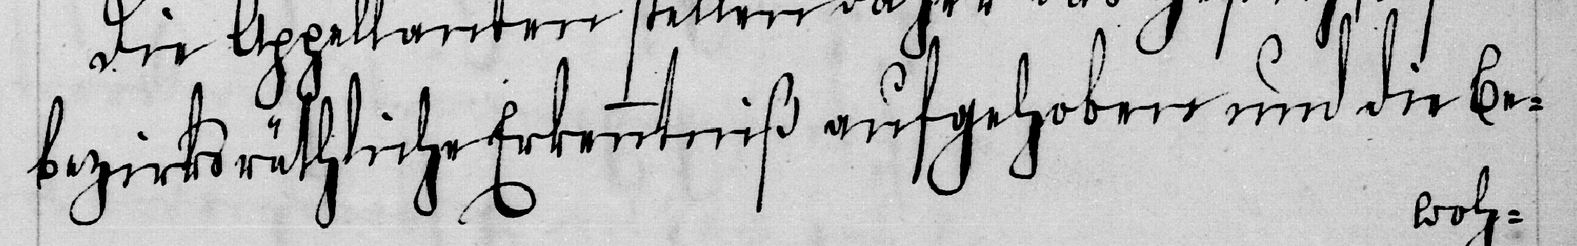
bezirksräthliche Erkenntniß aufgehoben und die Be
